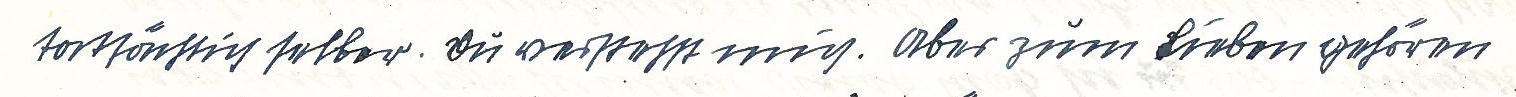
tatsächlich selber. Du verstehst mich. Aber zum Lieben gehören
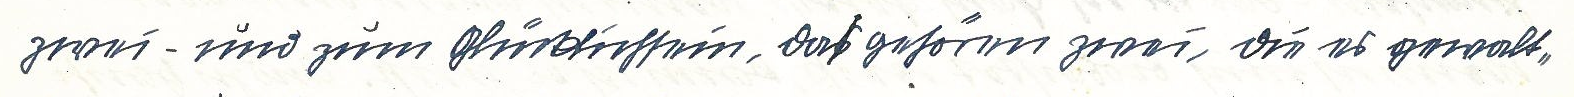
zwei – und zum Glücklichsein, das gehören zwei, die es gewalt¬
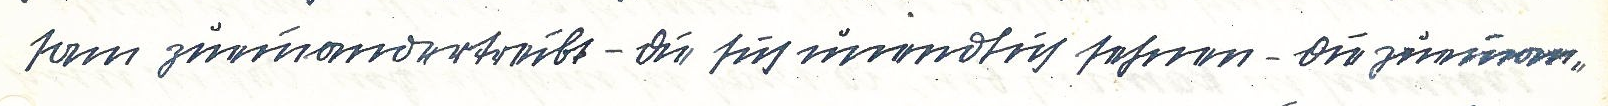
sam zueinandertreibt – die sich unendlich sehnen – die zueinan¬
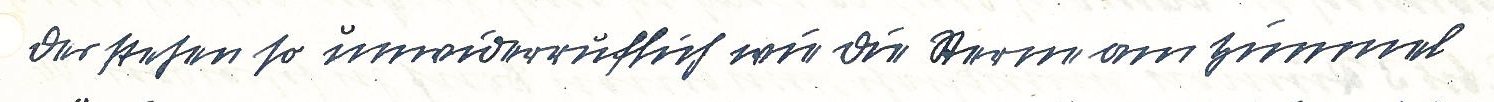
der stehen so unwiderruflich wie die Sterne am Himmel
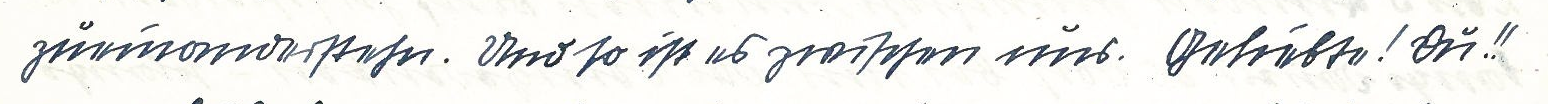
zueinanderstehen. Und so ist es zwischen uns. Geliebte, Du!!
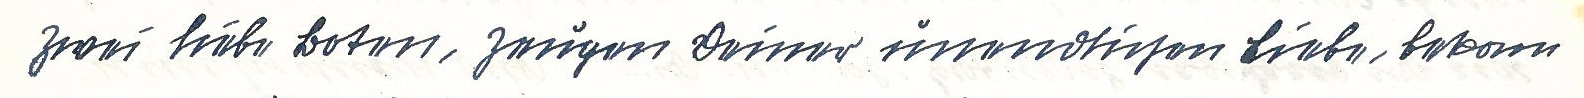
Zwei liebe Boten, Zeugen Deiner unendlichen Liebe, bekam
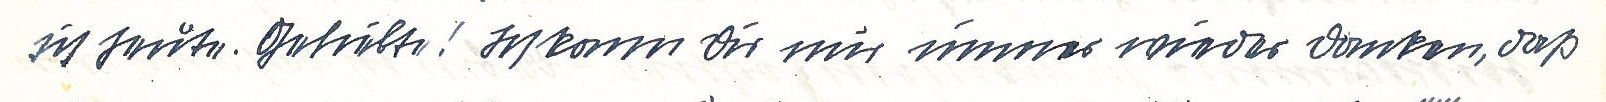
ich heute. Geliebte! Ich kann Dir nur immer wieder danken, daß
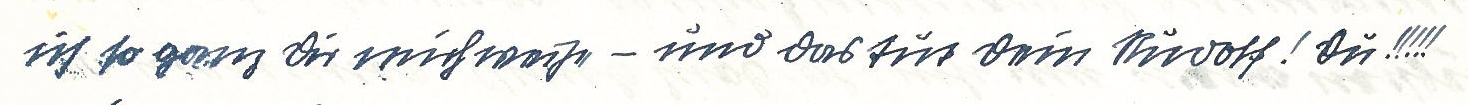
ich so ganz Dir mich weihe – und das tut Dein ! Du!!!!!
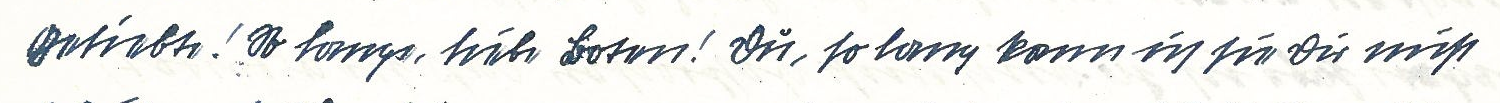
Geliebte! So lange, liebe Boten! Du, so lang kann ich sie Dir nicht
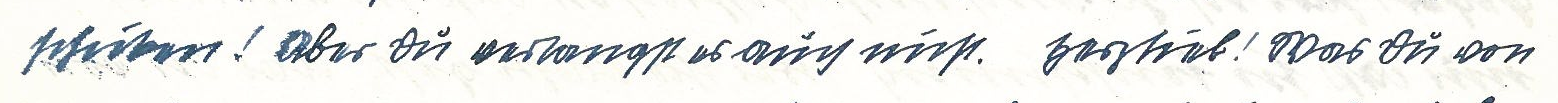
schicken! Aber Du verlangst es auch nicht. Herzlieb! Was Du von
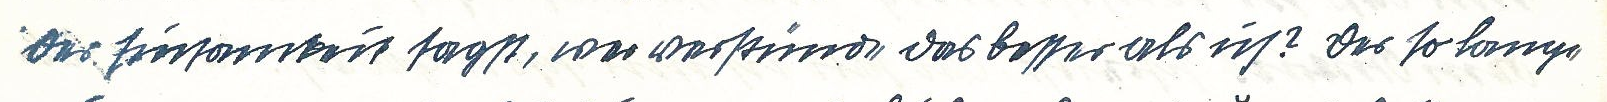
der Einsamkeit sagst, wer verstünde das besser als ich? Der so lange
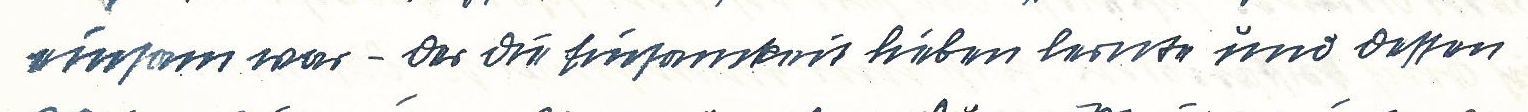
einsam war – der die Einsamkeit lieben lernte und dessen
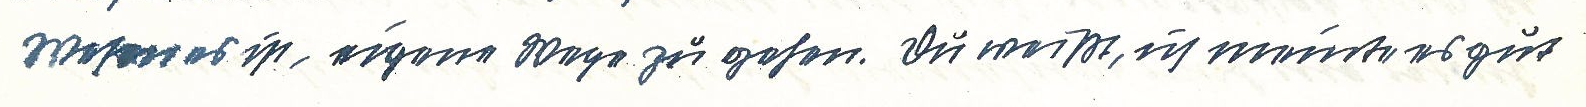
Wesen es ist, eigene Wege zu gehen. Du weißt, ich meinte es gut
